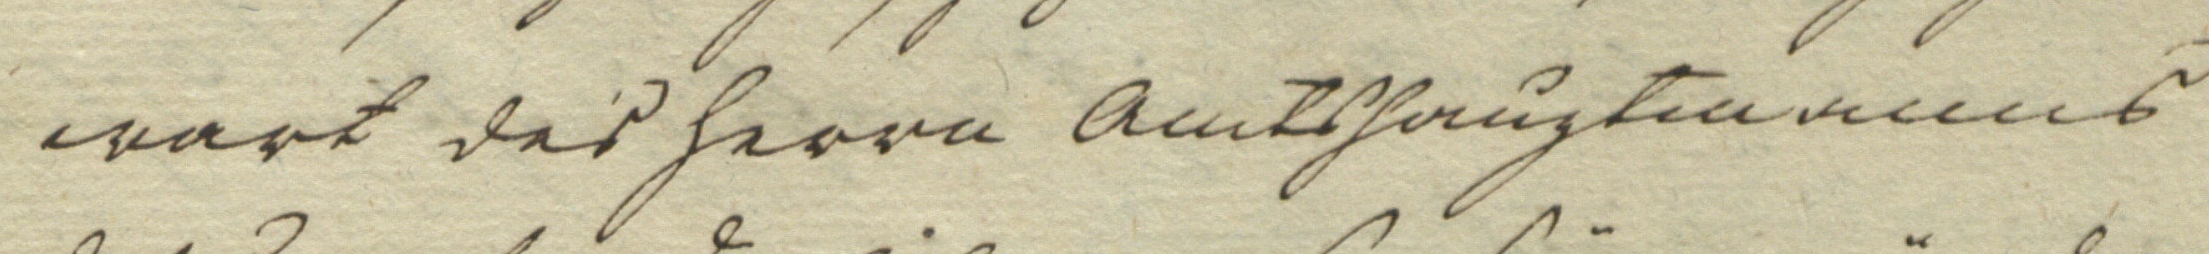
wart des Herrn Amtshauptmanns
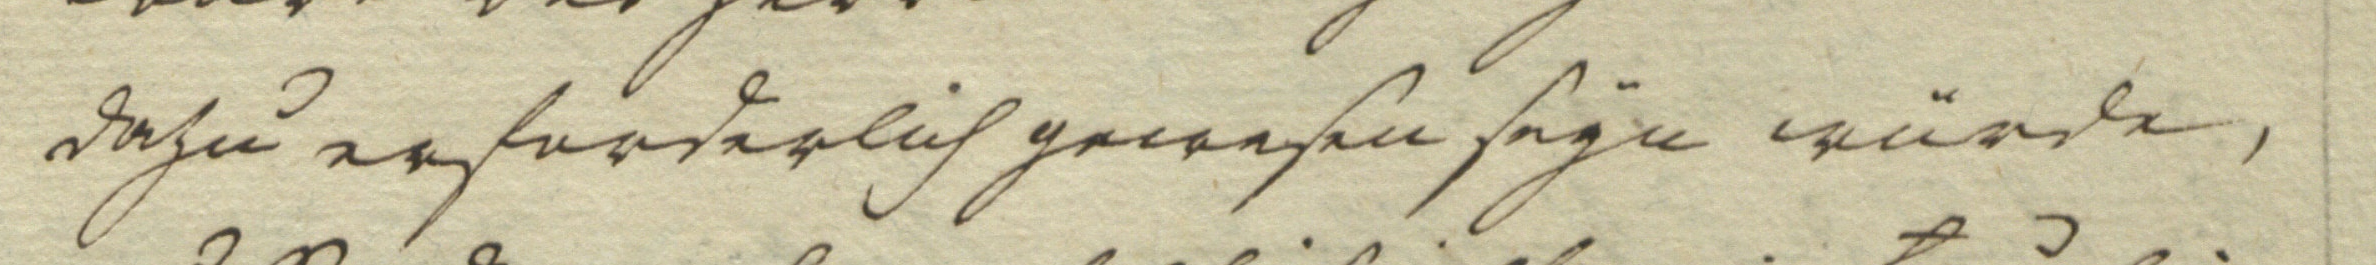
dazu erforderlich gewesen seÿn würde,
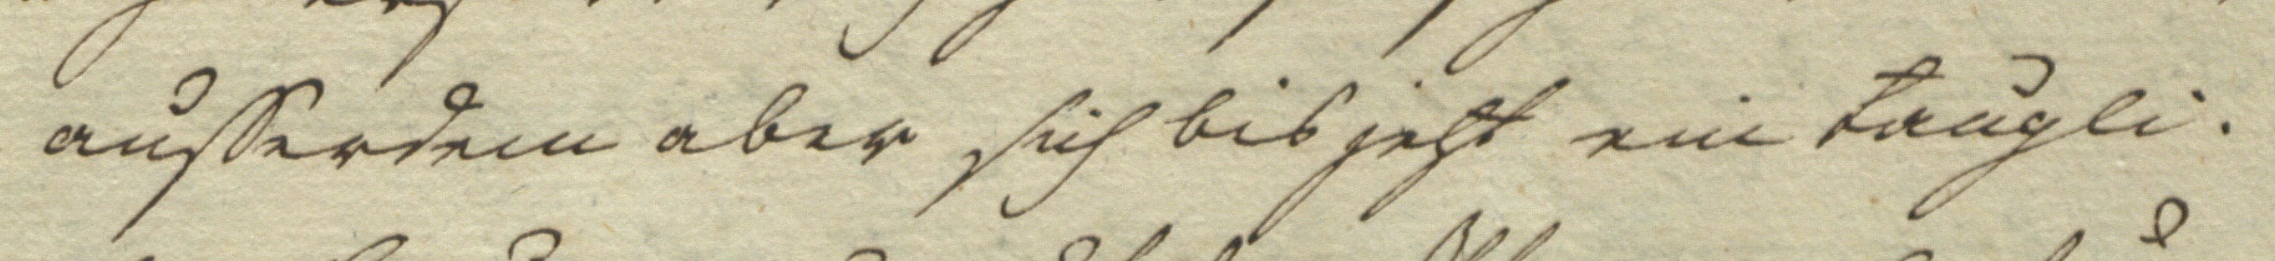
ausserdem aber sich bis jetzt ein taugli¬
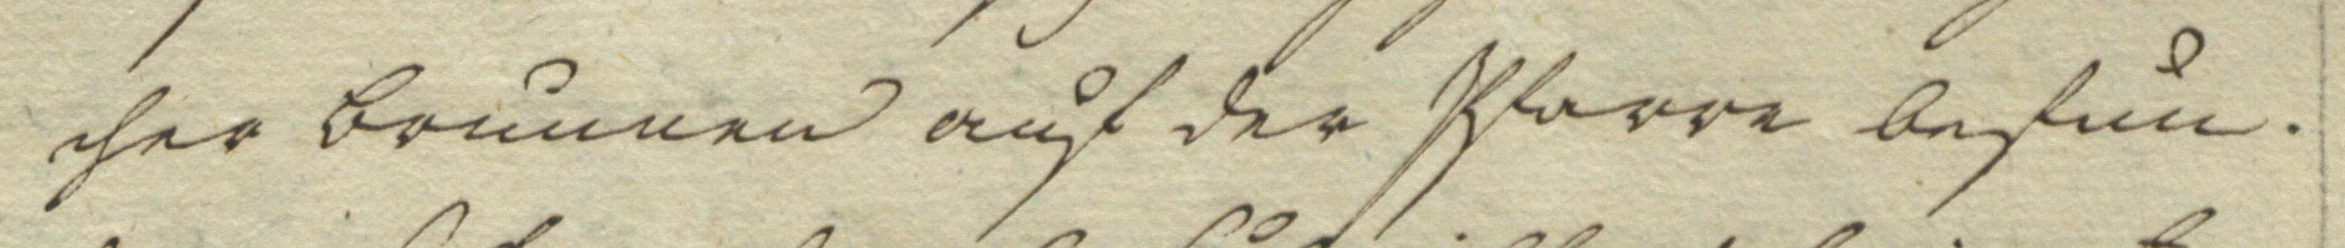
cher Brunnen auf der Pfarre befun¬
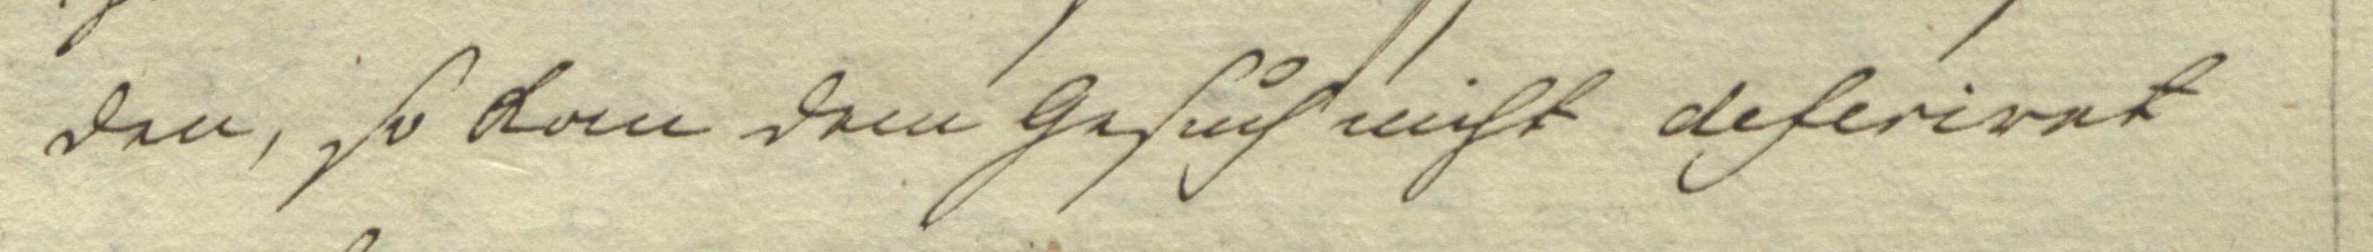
den, so kan dem Gesuch nicht deferiret
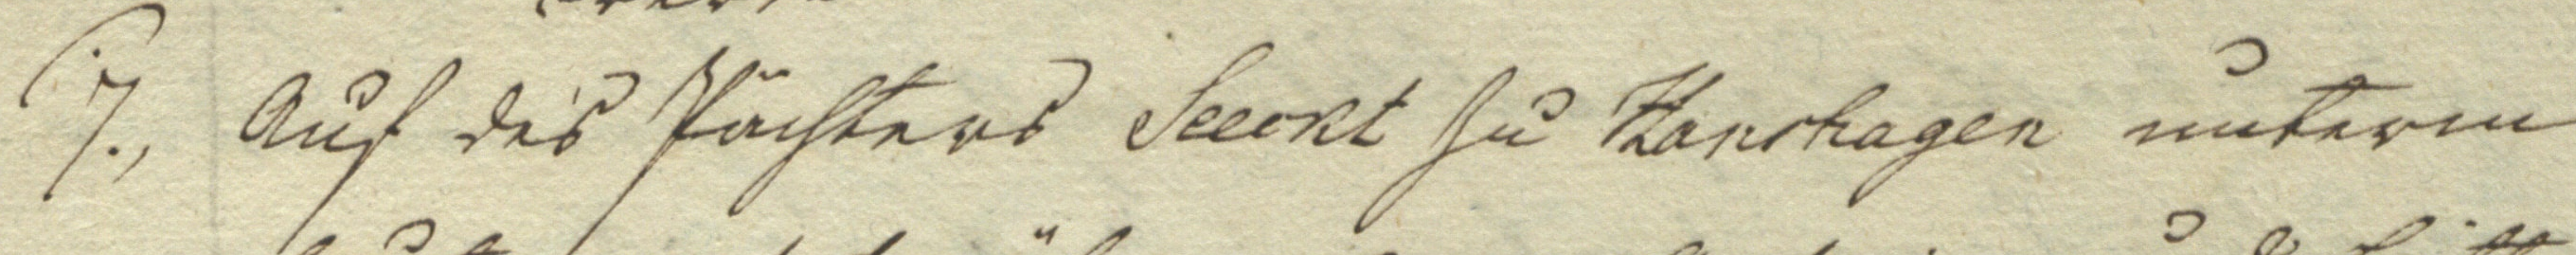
7., Auf des Pächters Seeckt zu Hanshagen unterm
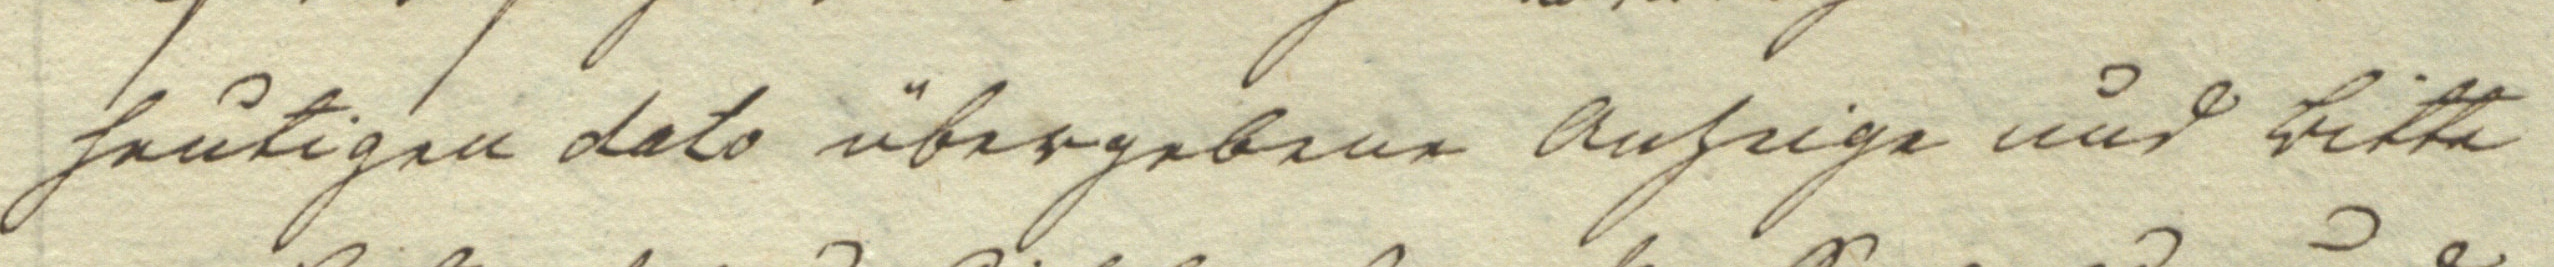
heutigen dato übergebene Anzeige und Bitte
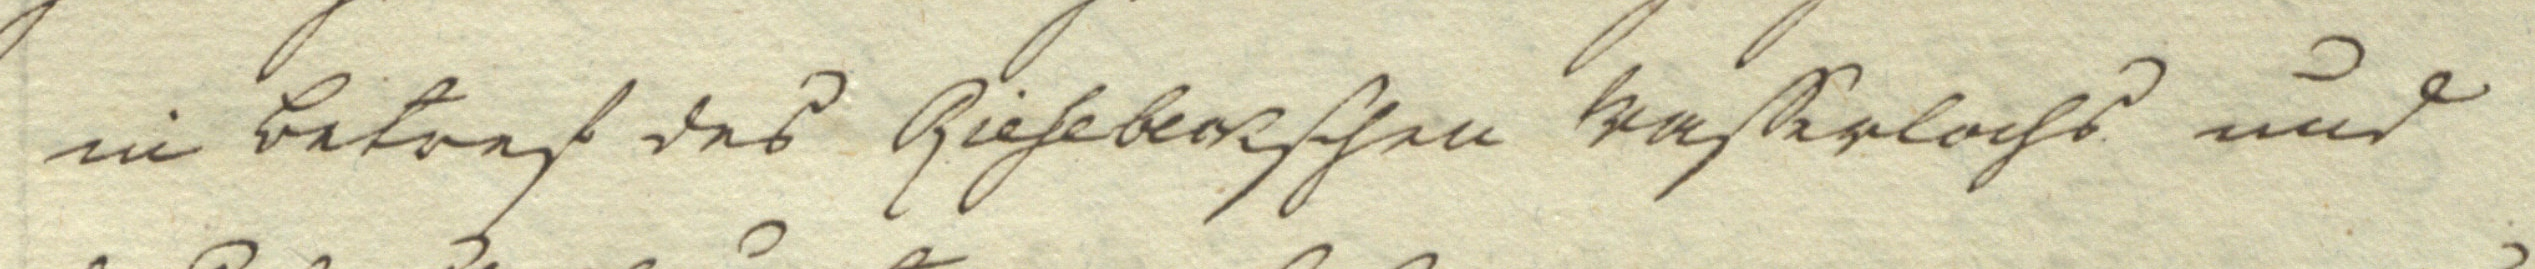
in Betref des Riesebeckschen Wasserlochs und
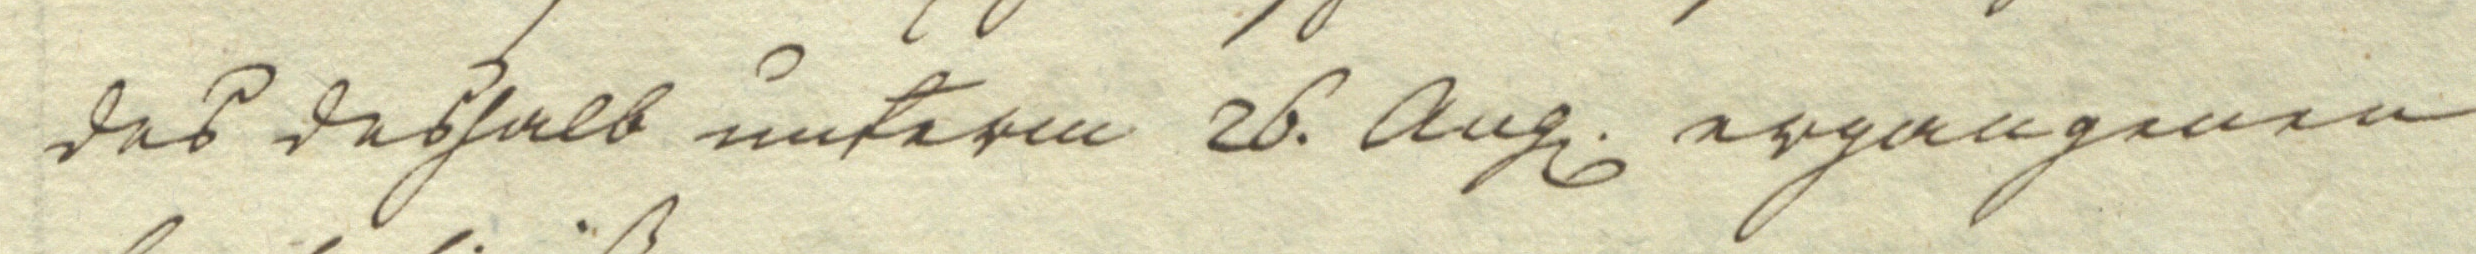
des deshalb unterm 26. Aug. ergangenen
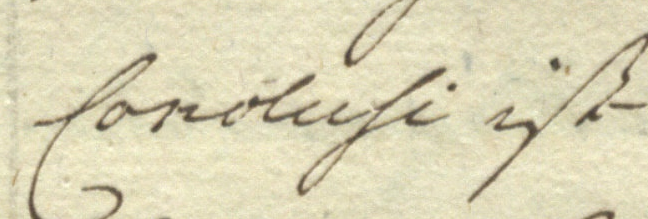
Conclusi ist
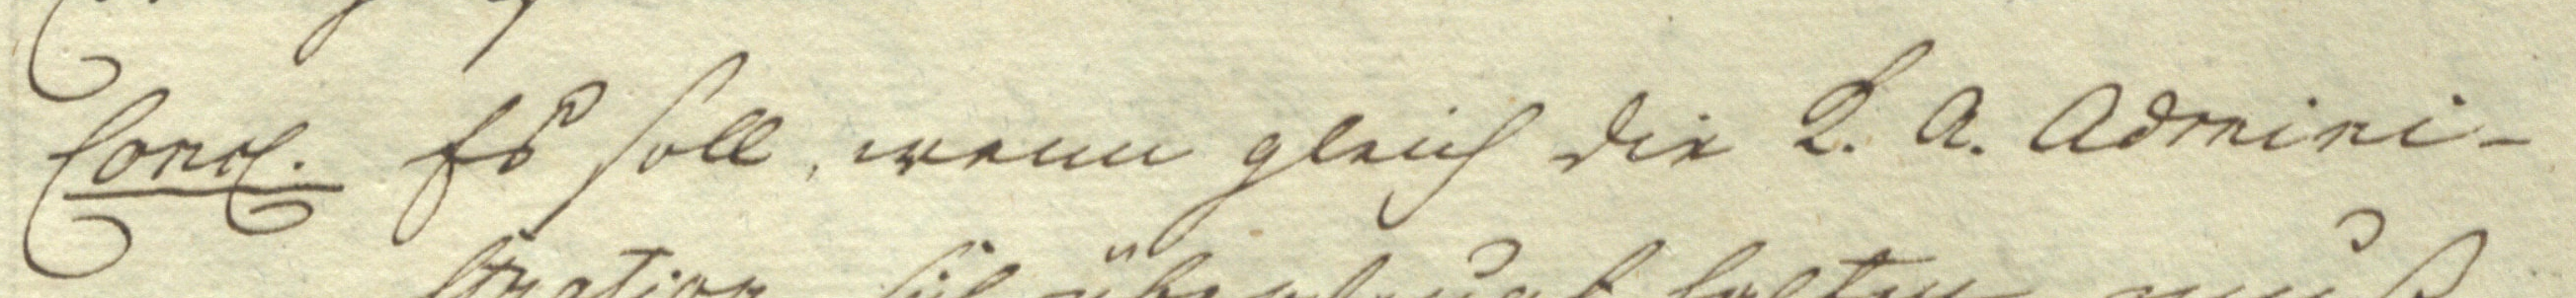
Concl. Es soll, wenn gleich die K. A. Admini¬
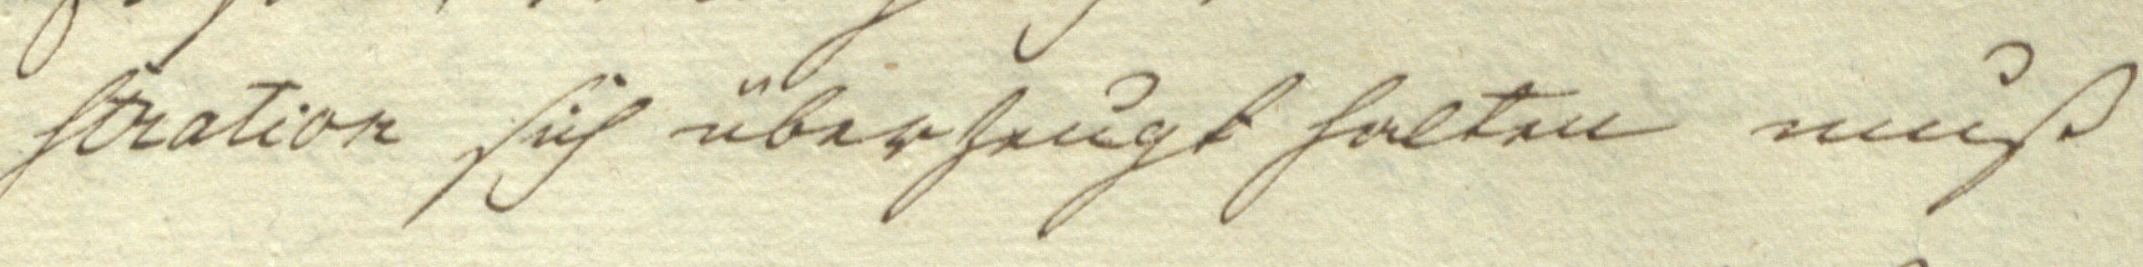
stration sich überzeugt halten muß
